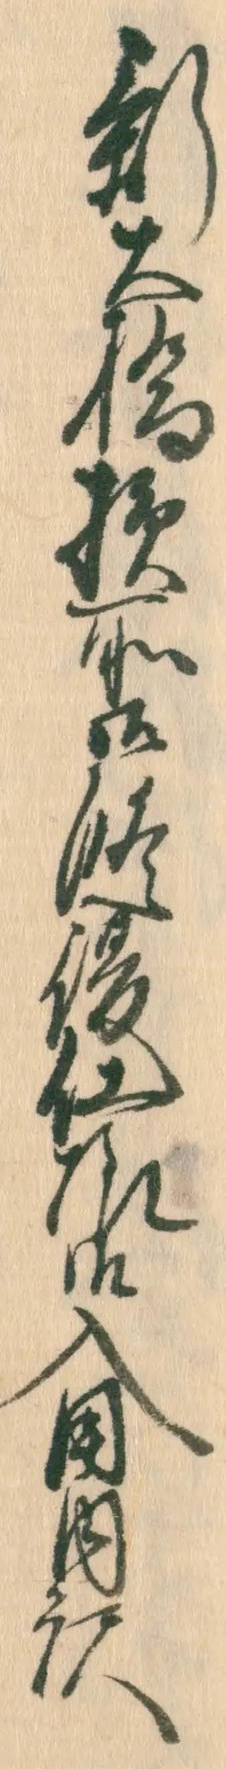新大橋損所御修復仕様御入用内訳
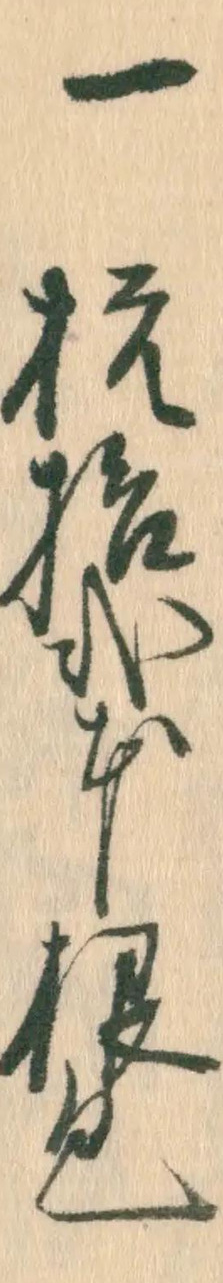一杭拾弐本根包
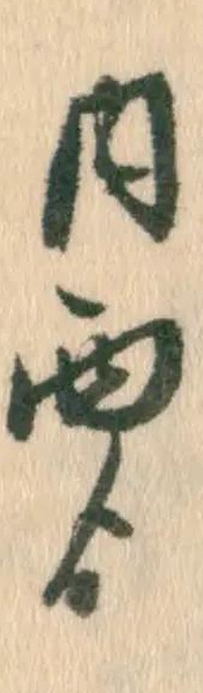内西ゟ
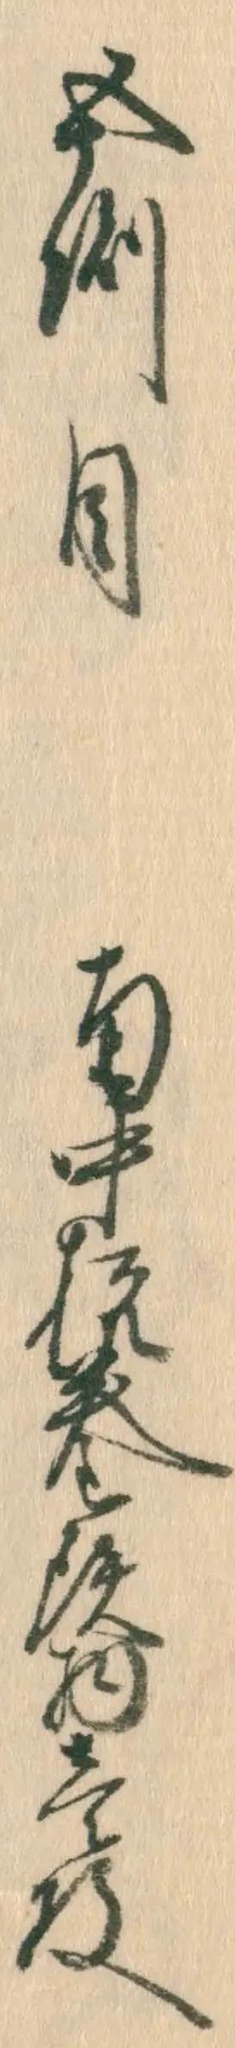五側目南中杭巻鉄物壱枚

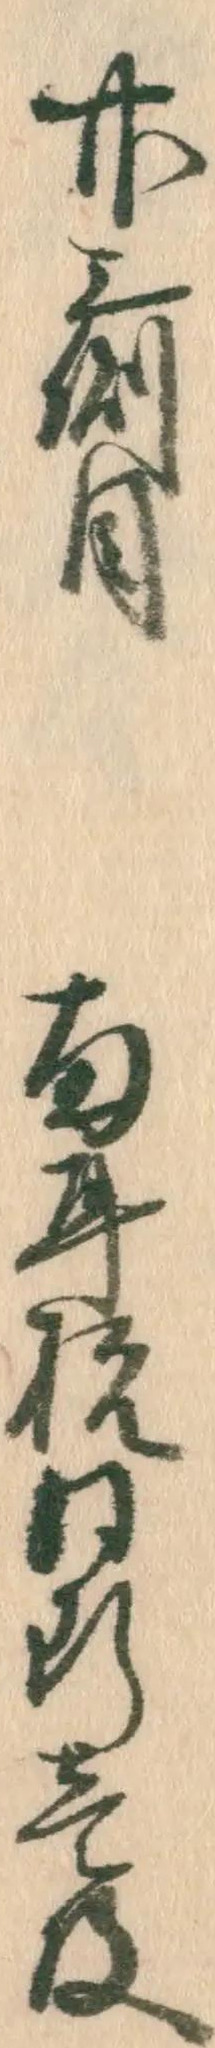廿三側目南耳杭同断壱枚
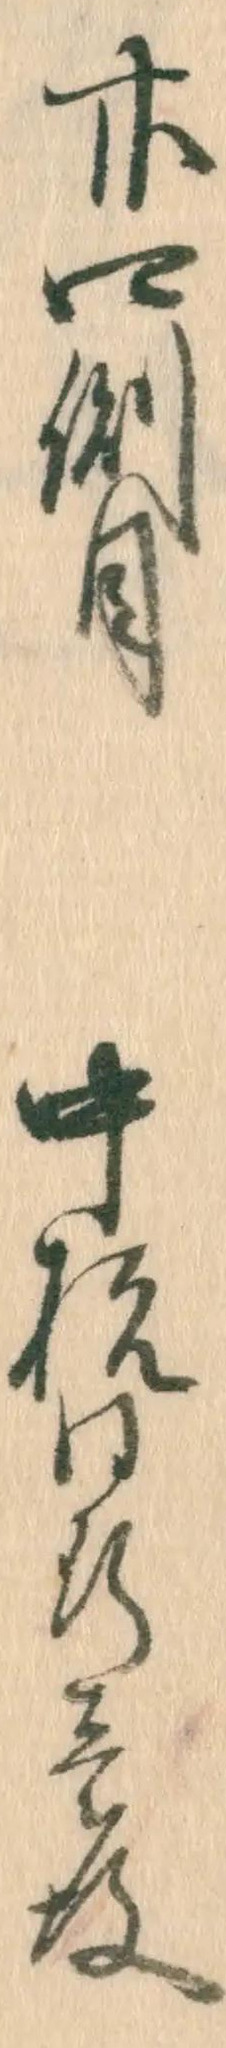廿四側目中杭同断壱枚
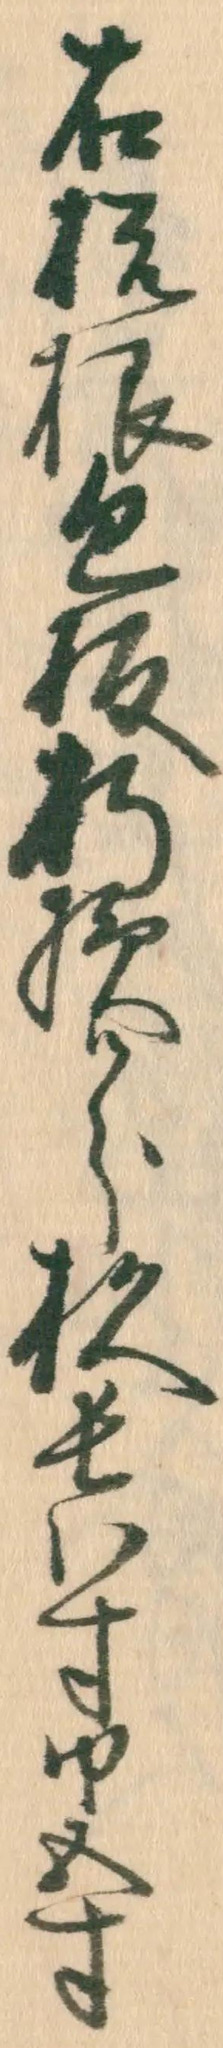右杭根包板朽損候分杉長八寸巾五寸
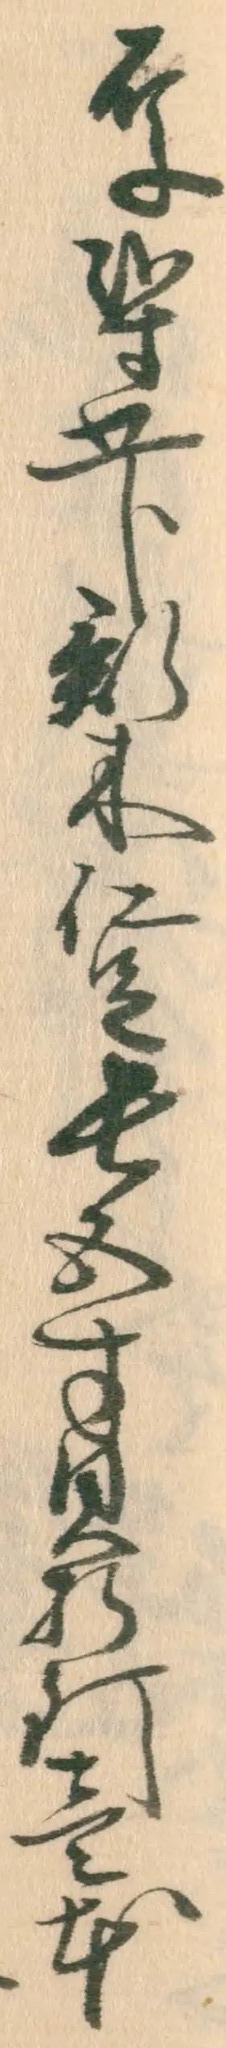厚弐寸五分新木仕足長五寸貝折釘壱本
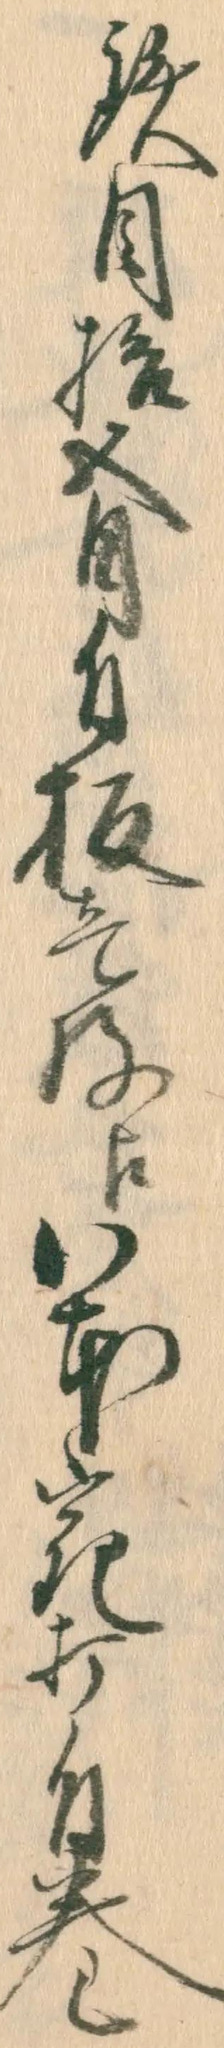鉄目拾五目付板壱枚え八本宛打付巻
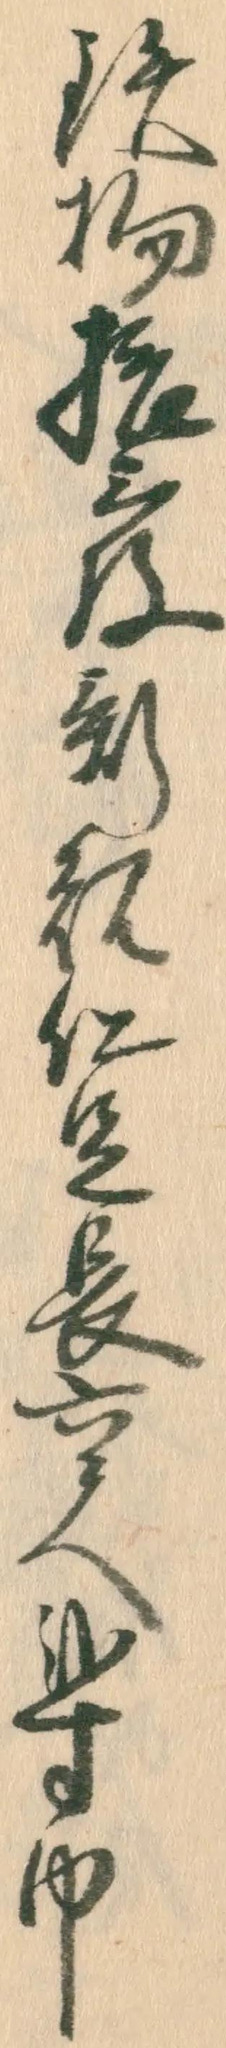鉄物拾三枚新規仕足長六尺弐寸巾
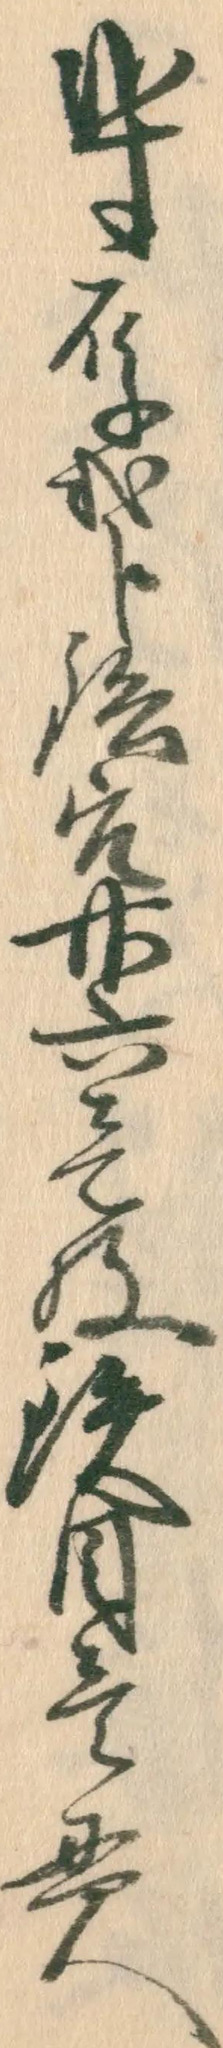弐寸厚弐分鋲穴廿六壱枚鉄目壱貫
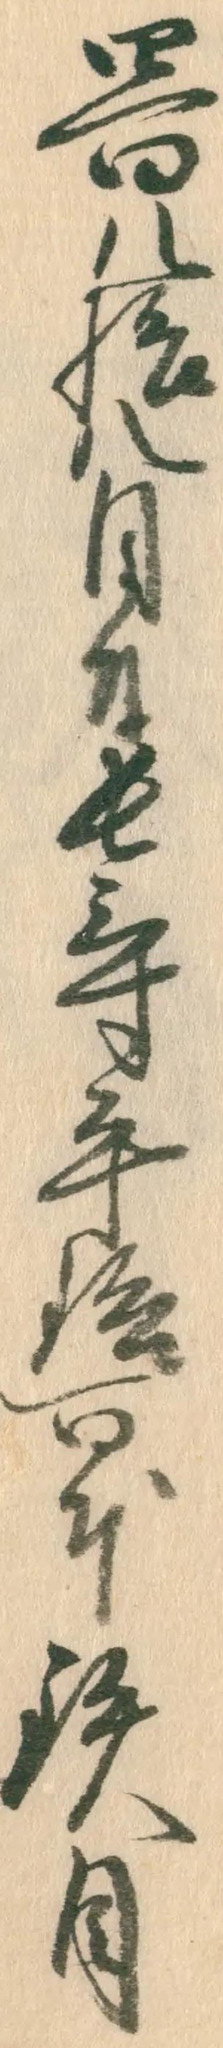四百八拾八目付長三寸平鋲百本鉄目
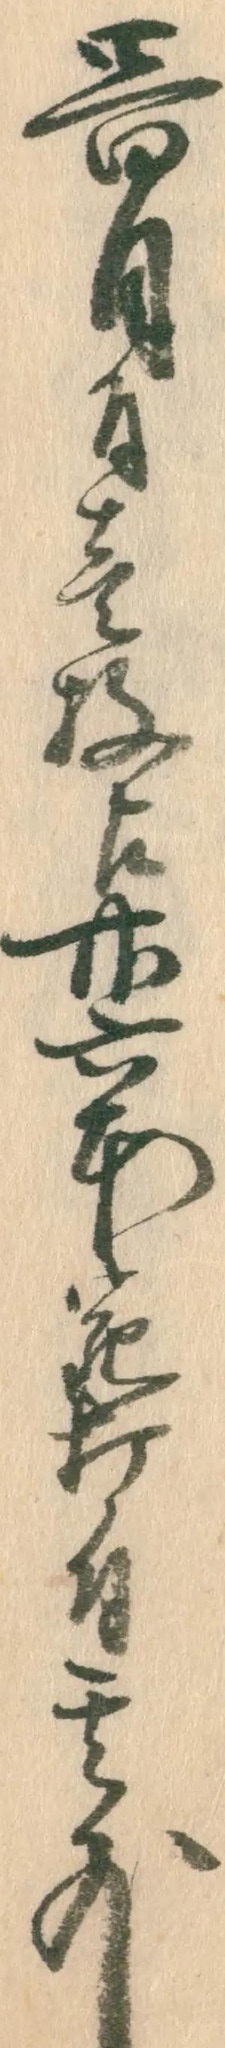四百目付壱枚え廿六本宛打付其外

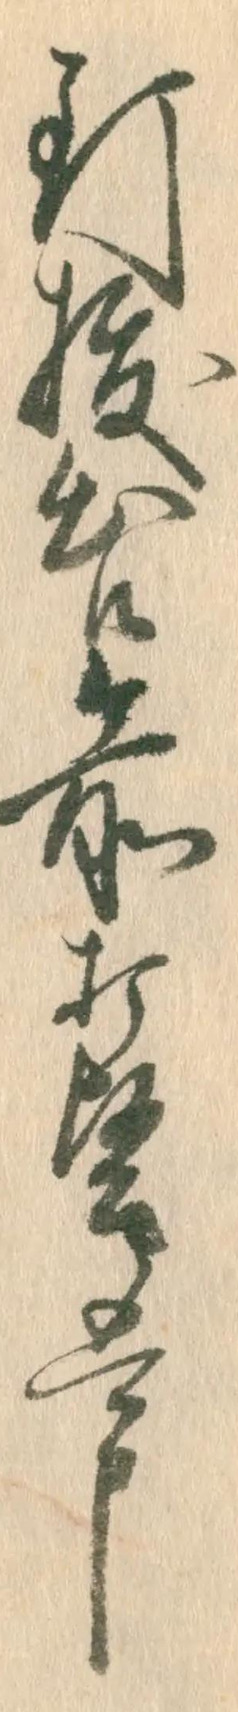釘抜出候ケ所打堅メ可申
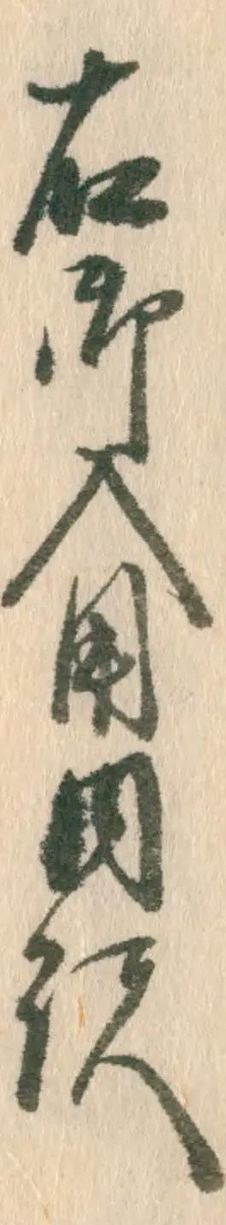右御入用内訳
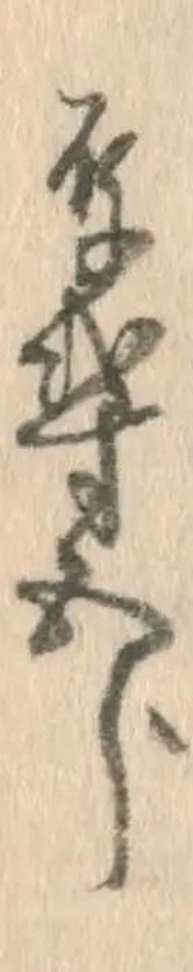厚弐寸五分
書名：三橋 17巻. [8] 三橋小破御修復書留　但御奉行御掛リ替地震潰橋番屋　嘉永四亥年より安政二卯年迄　下
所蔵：国立国会図書館 National Diet Library, JAPAN
